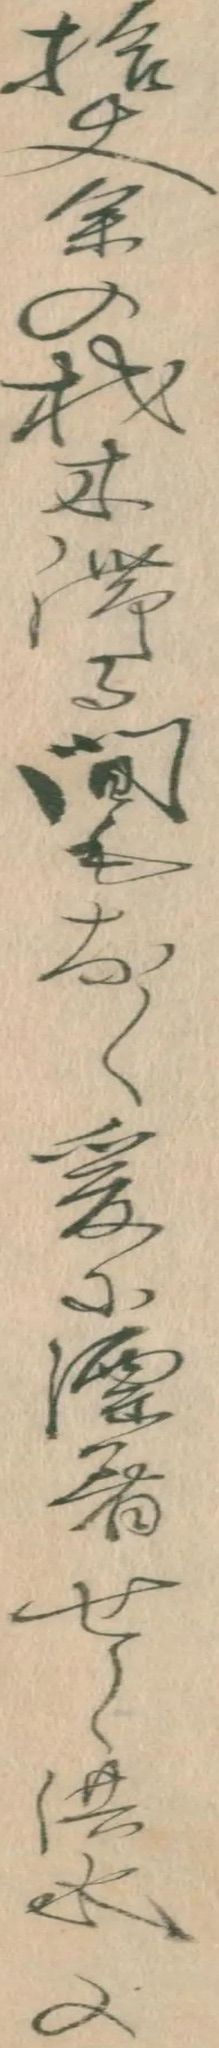拾丈余の材木滞る間もなく爰に漂着せし洪水の
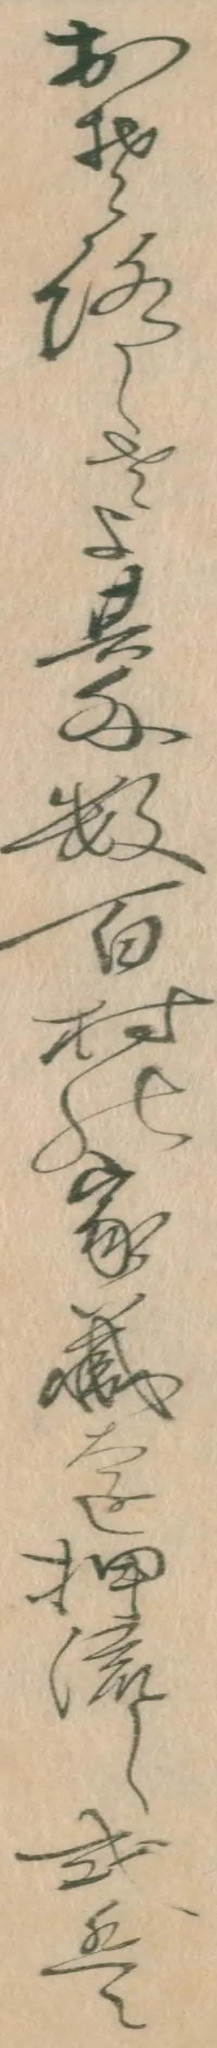おそろしさよ其外数百村の家蔵を押流し或は
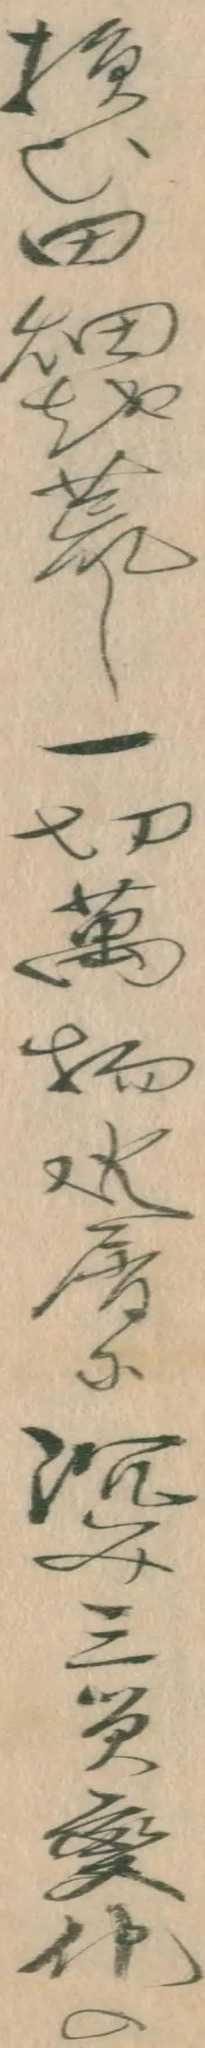損ひ田畑を荒し一切万物水屑に沈み三災変化の
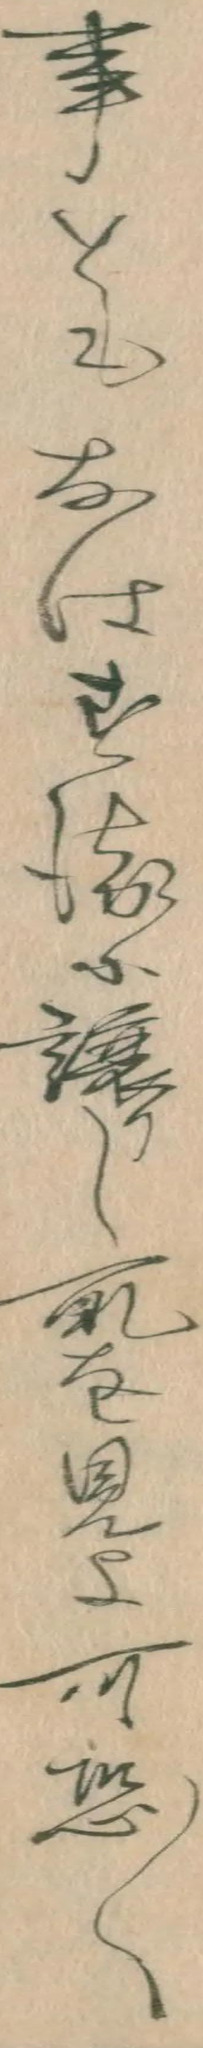事ともなはす流に譲りし所を見よ可恐〳〵

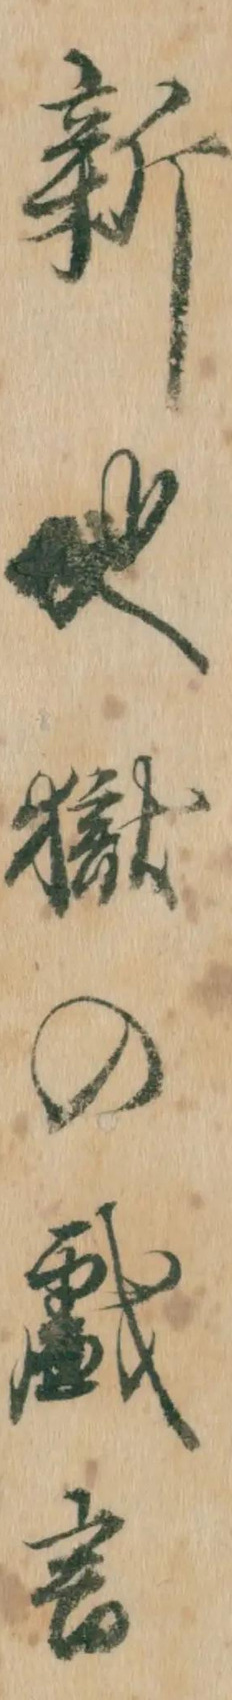新地獄の戯言
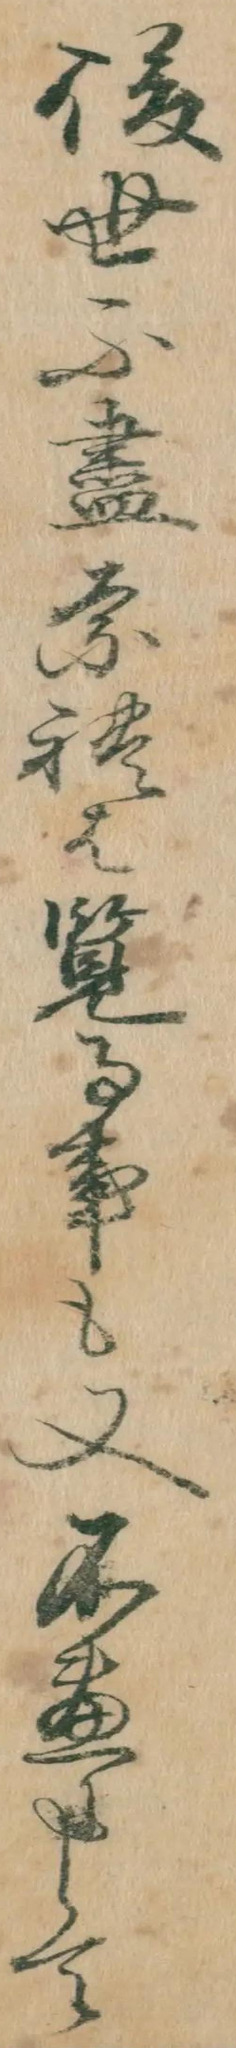後世不尽なれは覧る事も又不尽にして
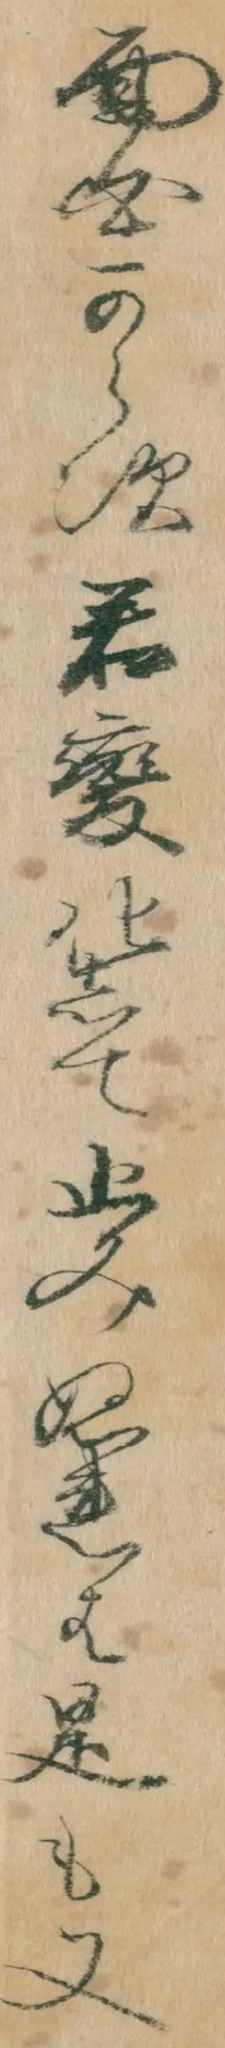面白からす若変化して止みぬれは是も又
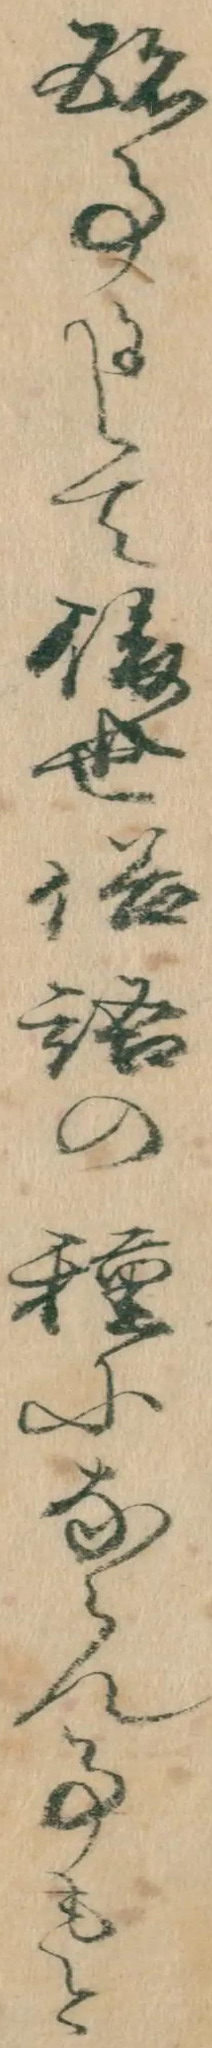珍事にして後世俗語の種にならん事もと
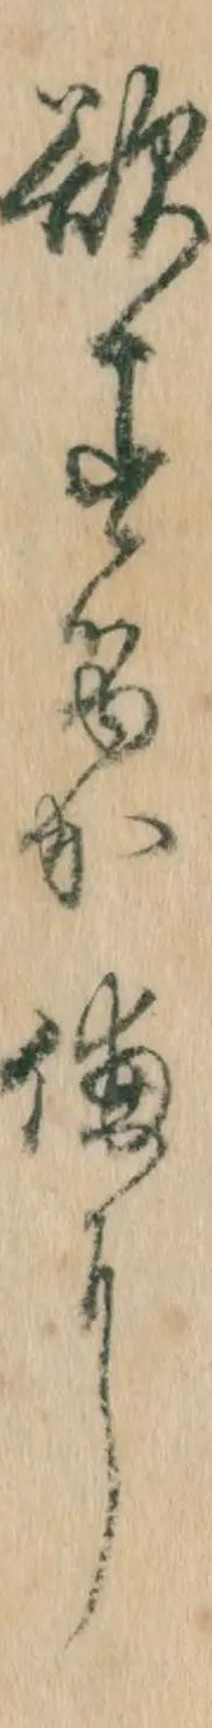欲するか侭に
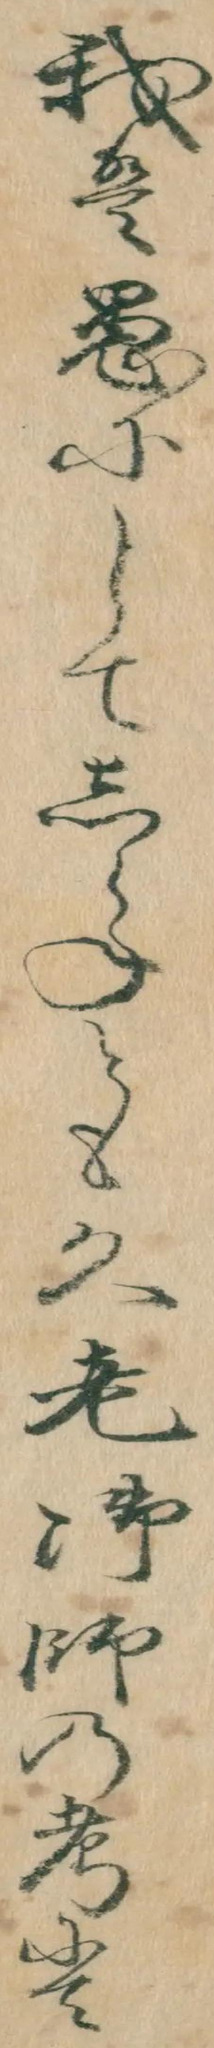我は愚にしてしらねとも久老御師の考にて
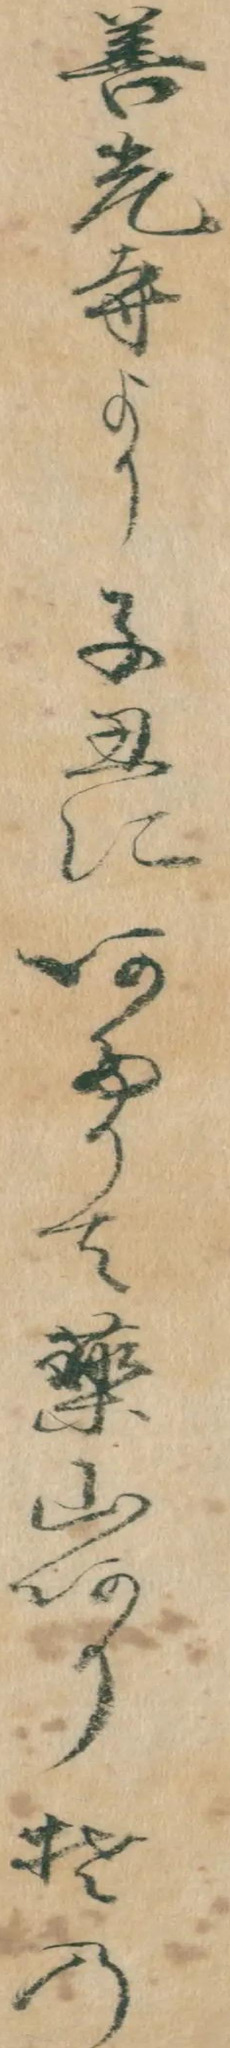善光寺より子丑にあたりて薬山ありその
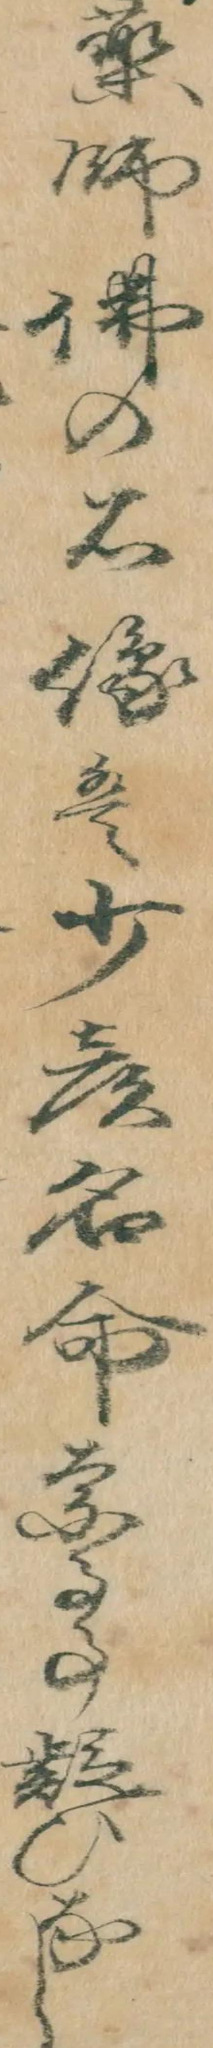薬師仏の石像は少彦名命なる事疑ひなし

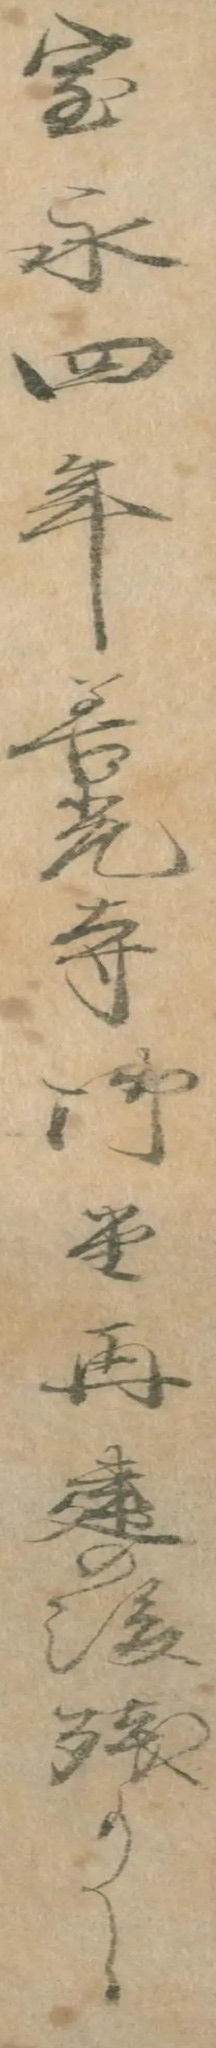宝永四年善光寺御堂再建の後残りし
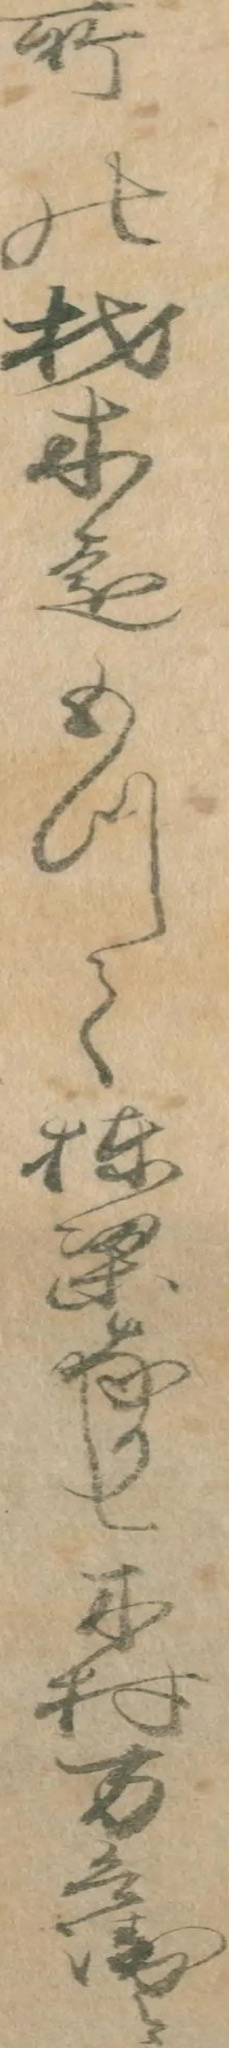所の材木をもつて棟梁なりし木村万兵衛と
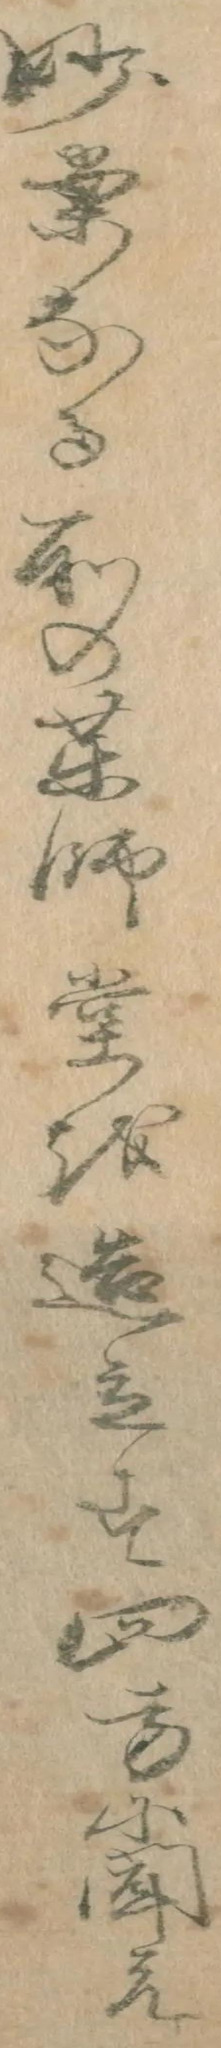妙業なる所の薬師堂を造立す四方に聞え
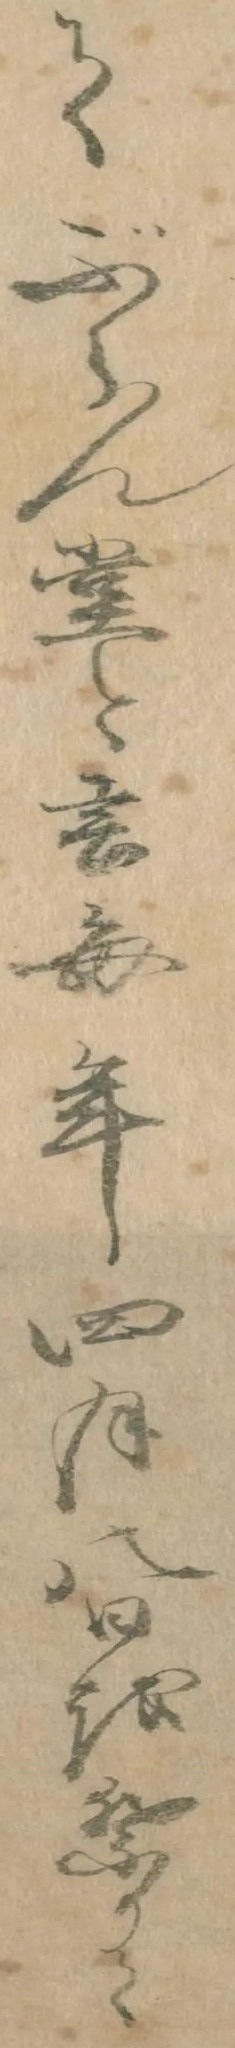てぶらん堂と言毎年四月八日を祭りて
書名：俗語之種. [6]
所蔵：国立国会図書館 National Diet Library, JAPAN
